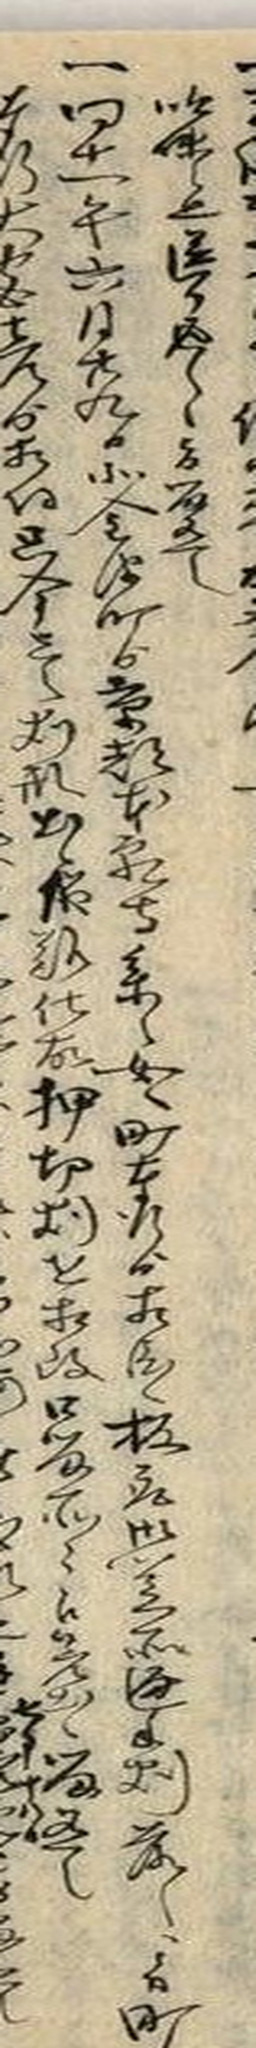奉行大宮彦右衛門相伺只今迄之判形出候様難仕故押切判を相改口留所々江差出候留有之
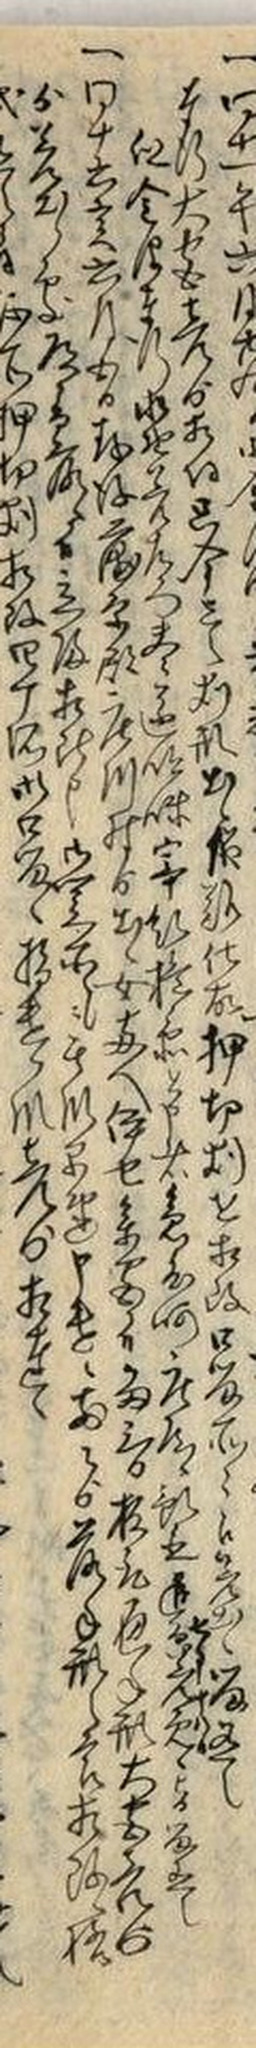一同十六亥六月五日越後蒲原郡庄川村ゟ出候女両人伊セ参宮ニ付留三日板取通手形大宮彦右衛門
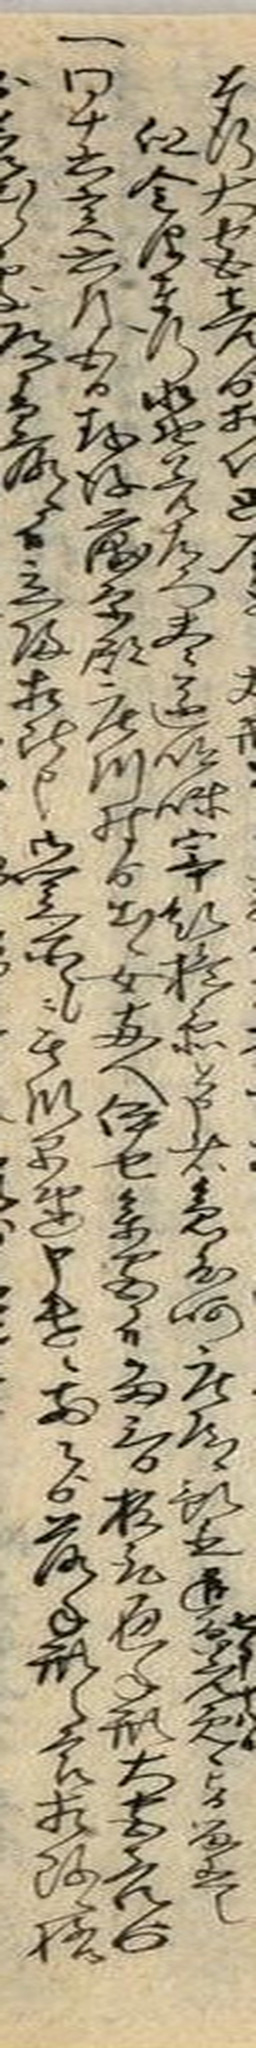ゟ差出候処道ニ而落し候ニ付立帰相断申御関所へも其段早速申遣候前々ゟ落手形之節相改候格
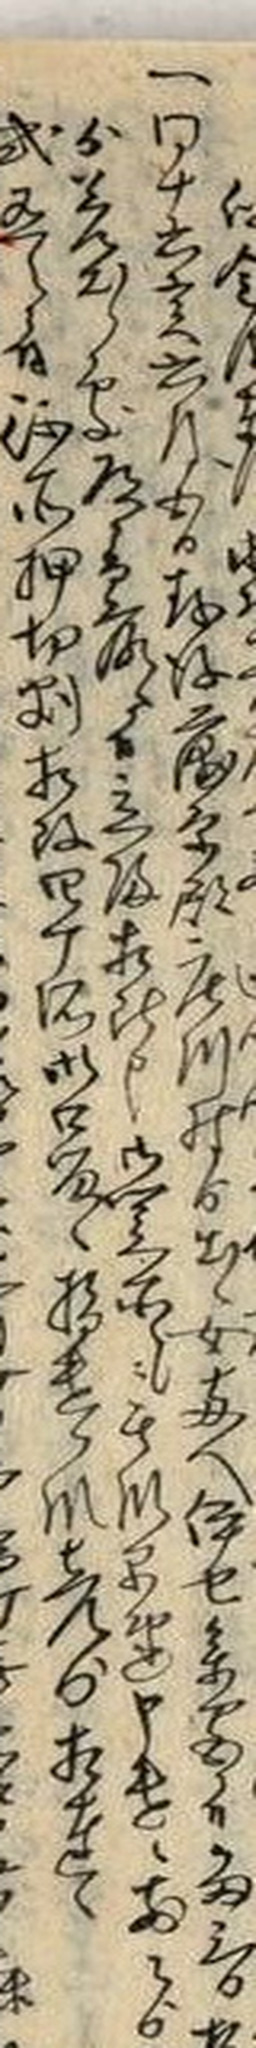式有之ニ付役所押切判相改四ケ所御口留へ指遣候段彦右衛門相達候
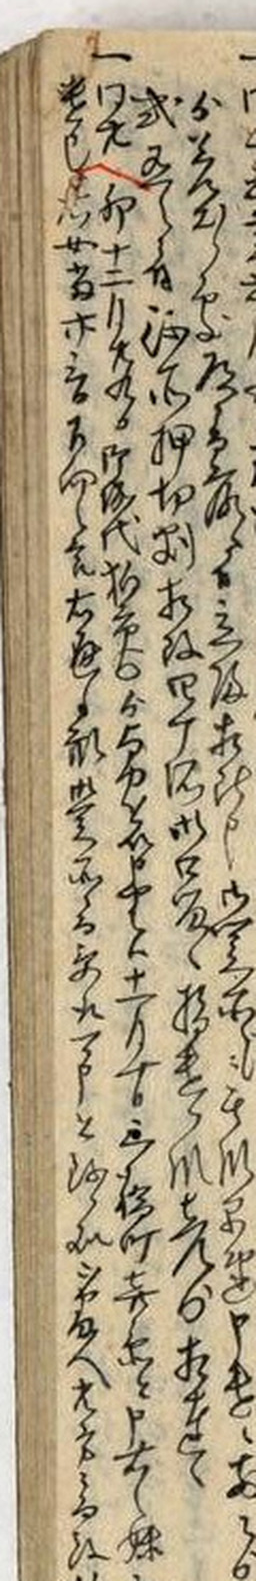一同廿卯十二月廿九日御城代狛市右衛門ゟ与力を以申聞候ハ十一月十日三ツ
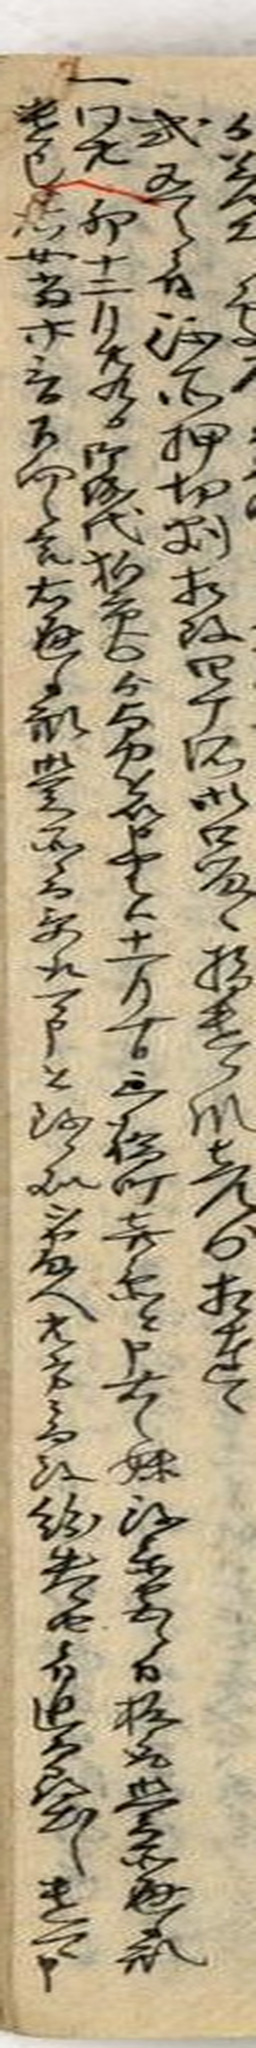遣申候右女当廿三日下向之節右通手形御関所ニ而受取可申と致候処御番人共方ニ而致紛失候由ニ付追而尋出し遣可申

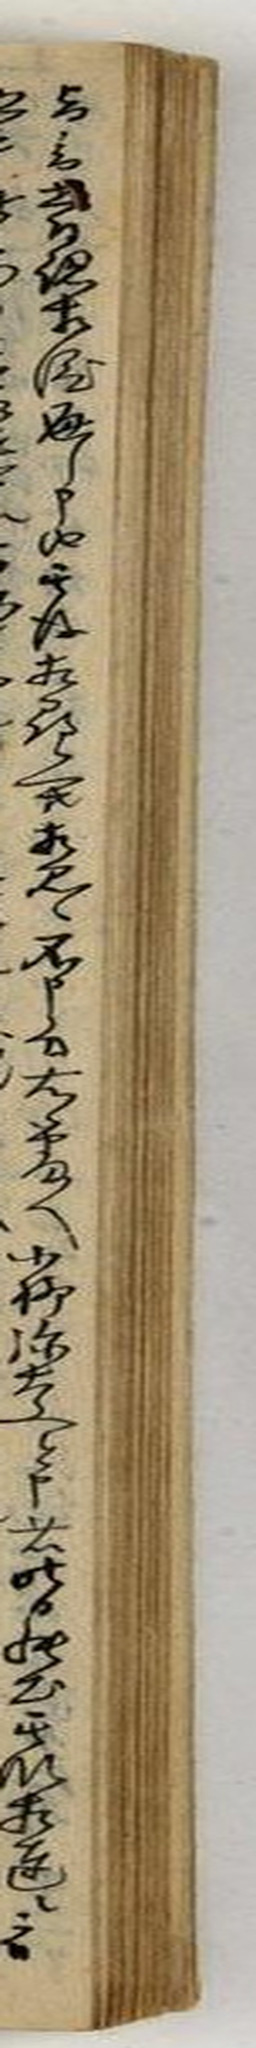旨ニ而書付認相渡通し申由其後相尋候へ共相見へ不申付右御番人小柳弥太夫と申者昨日罷出其段相達候ニ付
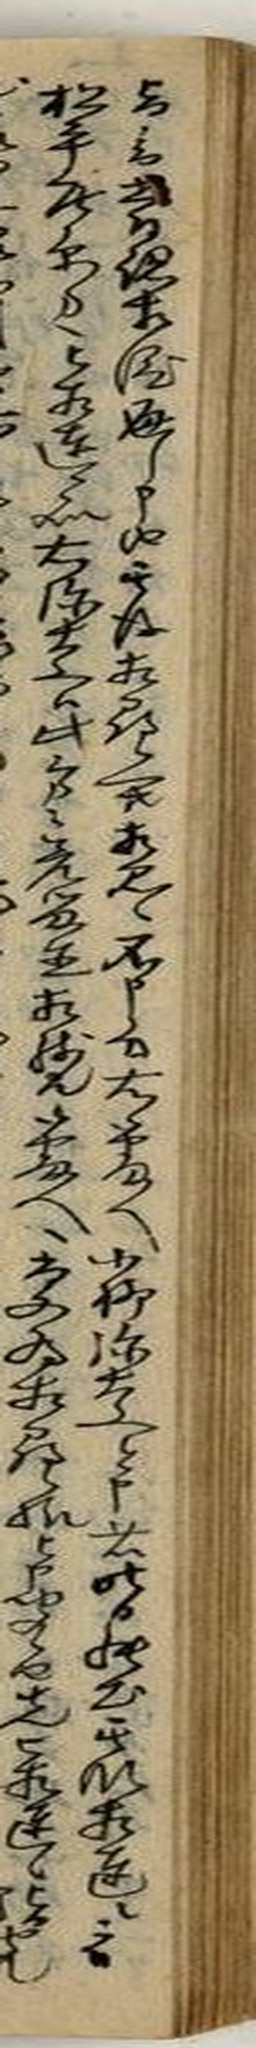松平庄兵衛方へ被相達候処右弥太夫ハ此方ニ差留置相残ル御番人へ尚又為相尋候様被申聞候由先被相達候旨申聞候
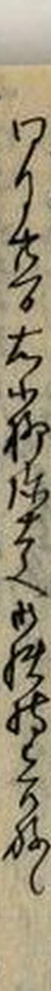同月廿一日右小柳弥太夫御扶持被召放候
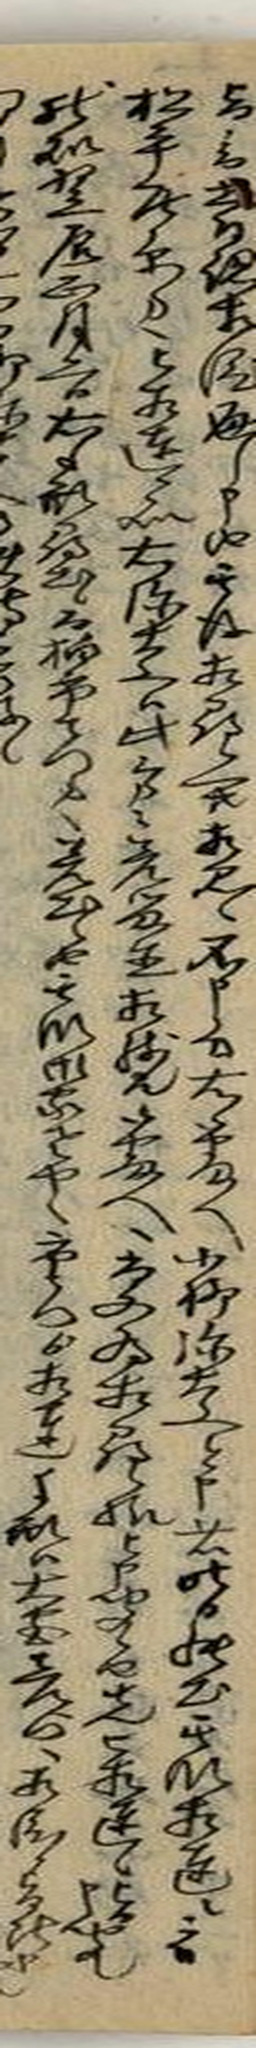然処翌辰正月二日右手形尋出候而狛市右衛門方へ差出候由其段御家老中へ市右衛門ゟ相達手形ハ大宮彦右衛門へ相渡候旨断申聞候
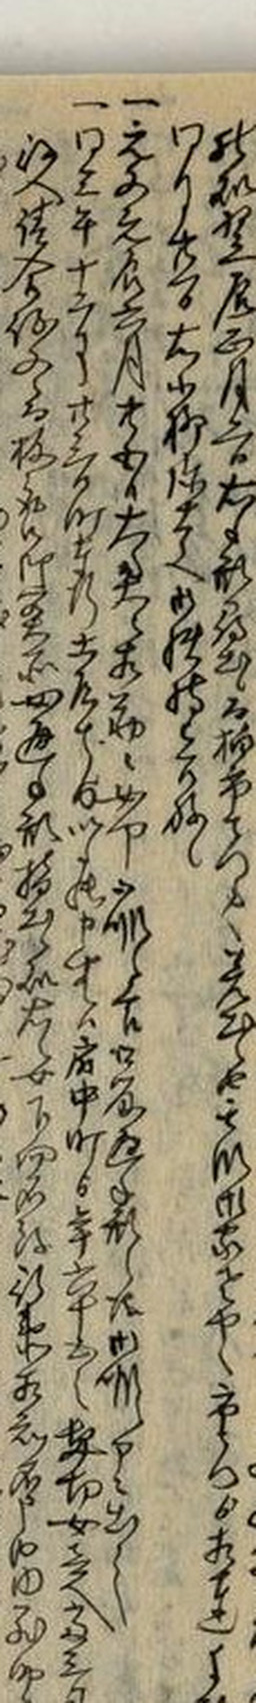一元文元辰六月廿五日大奥へ相勤候女中御暇之節口留通手形之儀御暇之部ニ出之
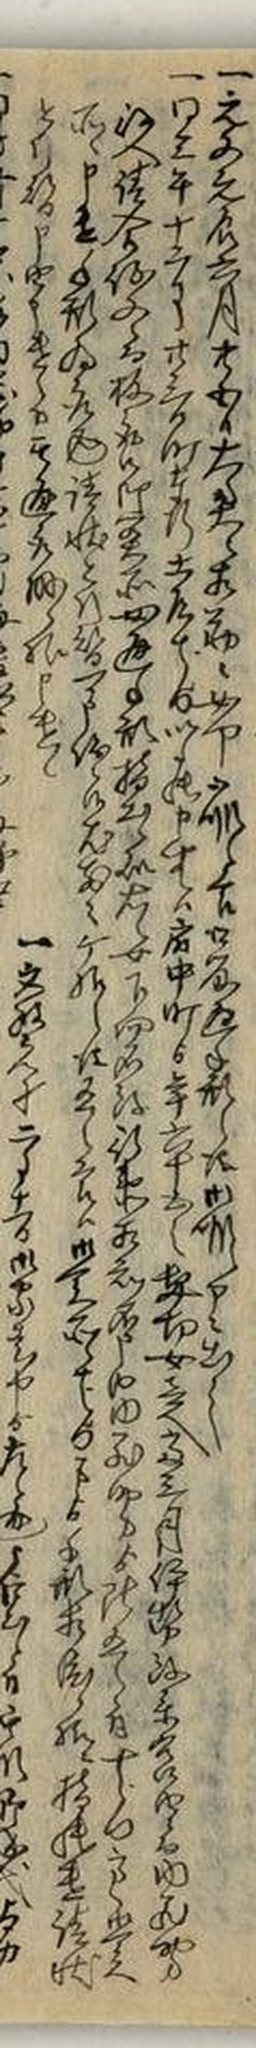役人請合証文ニ而板取口御関所女通手形指出候処右之女下向不致行衛相知不申由内蔵助方ゟ断有之ニ付十郎右衛門方御関
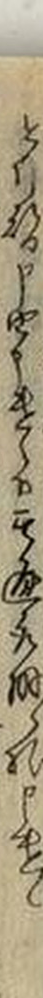と引替申由申遣候付其通取扱候様申遣候
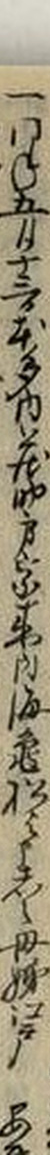一同年五月十三日本多内蔵助方家来内海亀松与申者之母姉江戸
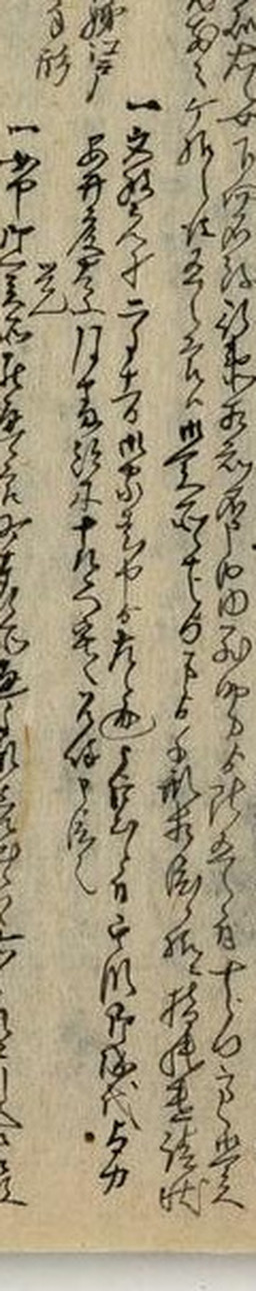一文政元寅二月十一日御家老中ゟ左之通被仰出候ニ付其段御城代与力
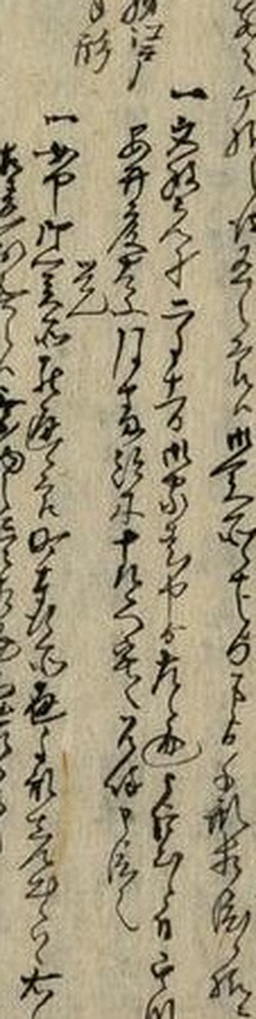安井藤太夫月番鈴木十左衛門宅へ召呼申渡之
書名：御国他国諸事之部
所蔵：福井県文書館 Fukui Prefectural Archives
